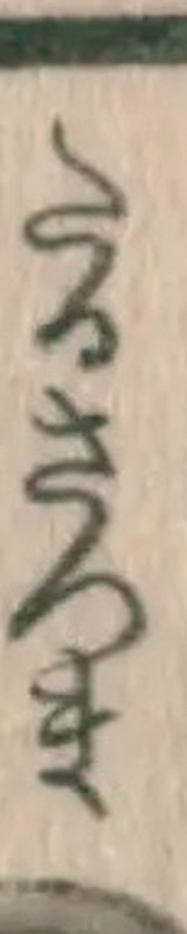たるさつま
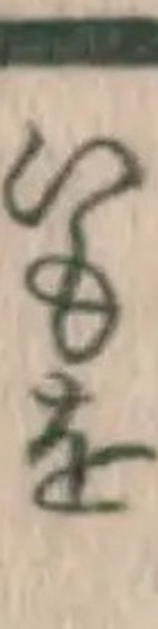いもを
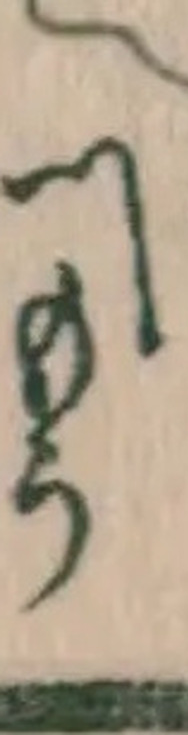〽もう
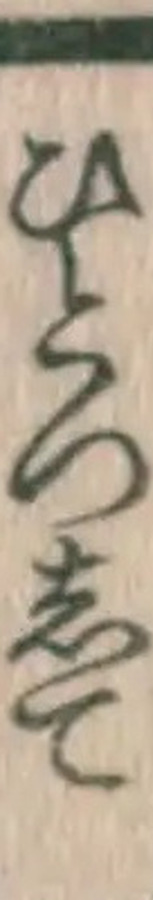ひとつして
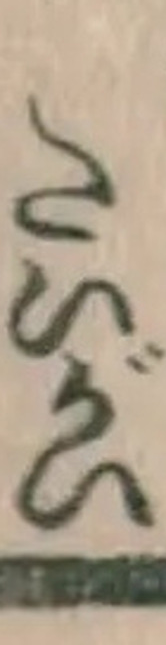たいがい
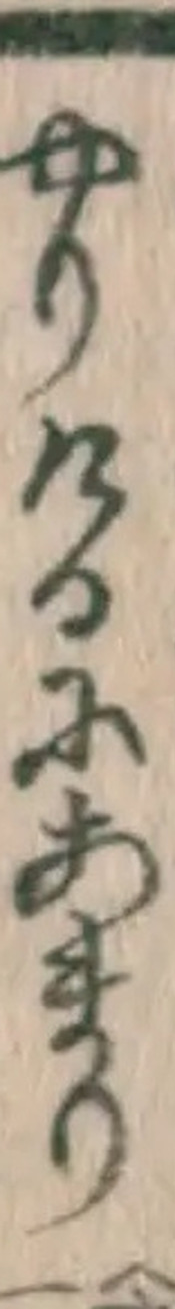やりけるにあまり
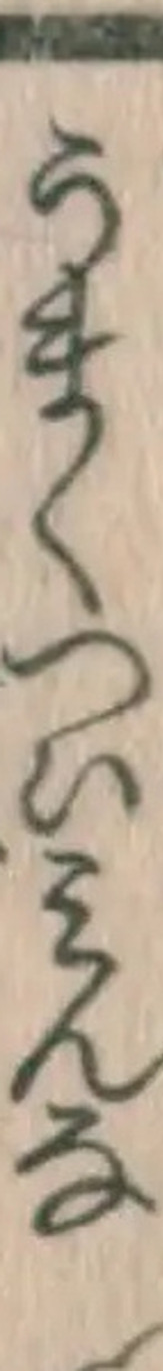うまくついみんな
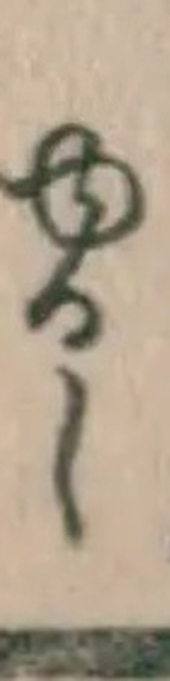ゆるし
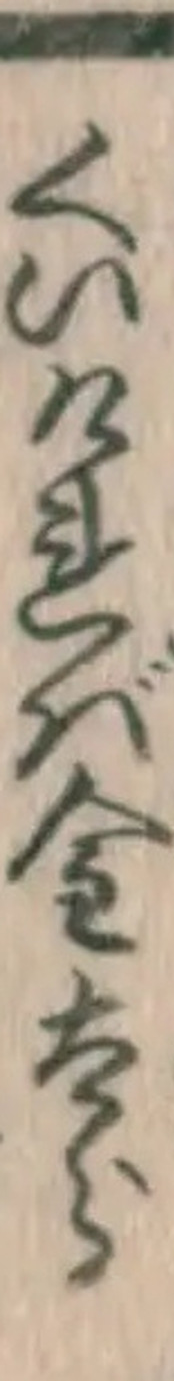くいければ金太郎
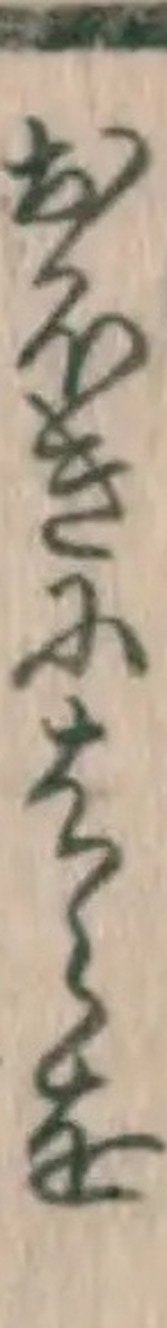おほきにはらを
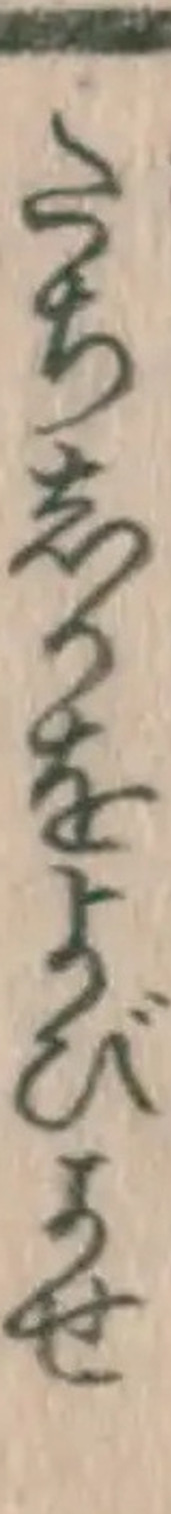たちしかをよびよせ
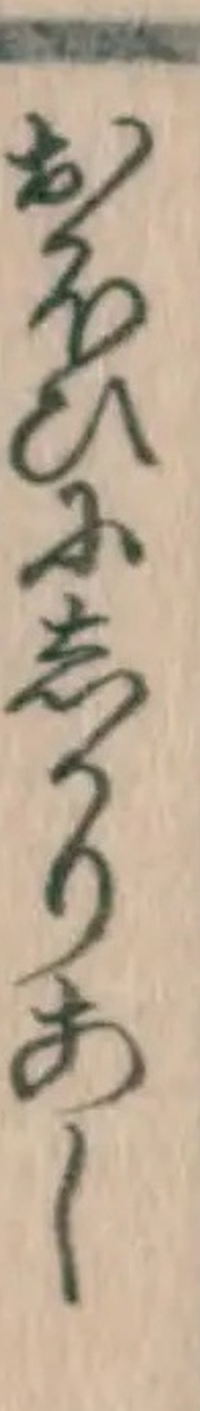おほいにしかりあし
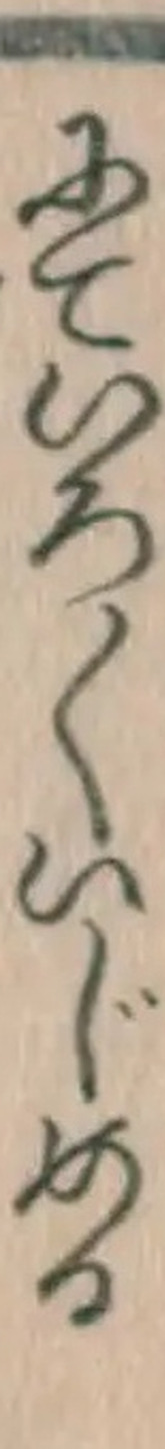にていろ〳〵いじめる
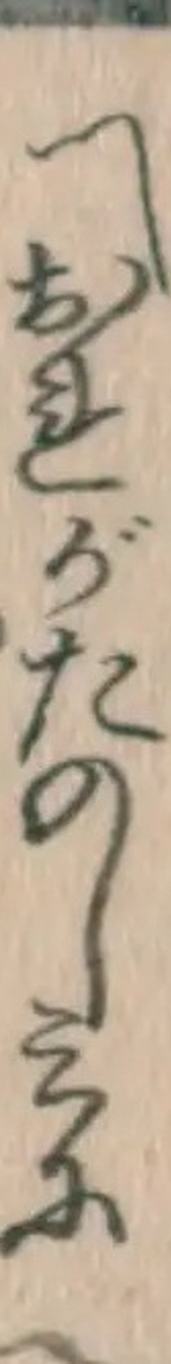〽おれがたのしみに
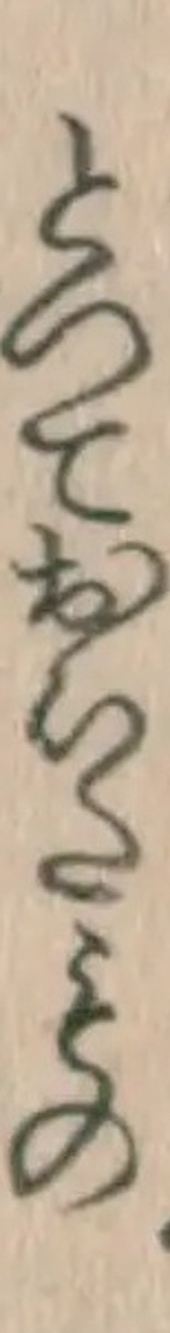とつておいたもの
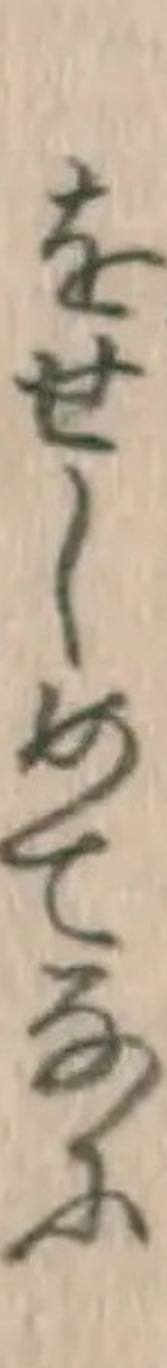をせしめてなに
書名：金太郎
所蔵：国立国会図書館 National Diet Library, JAPAN
